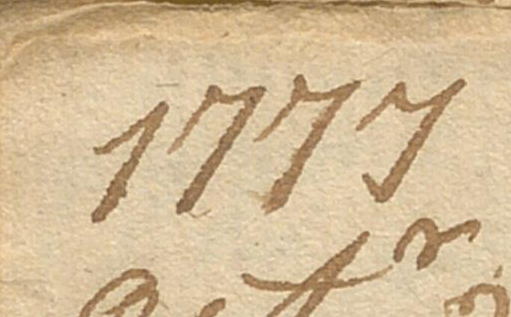1777
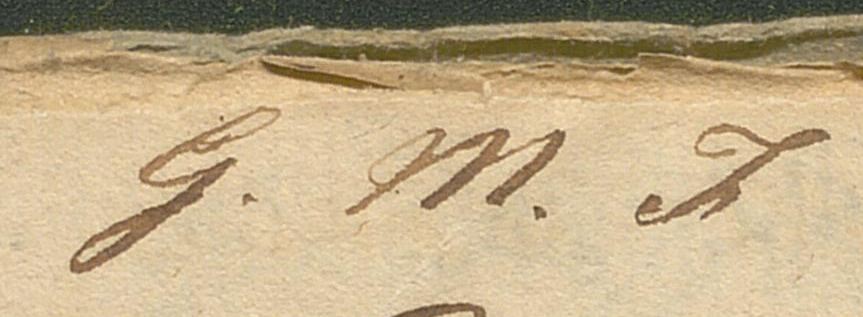G. M. F
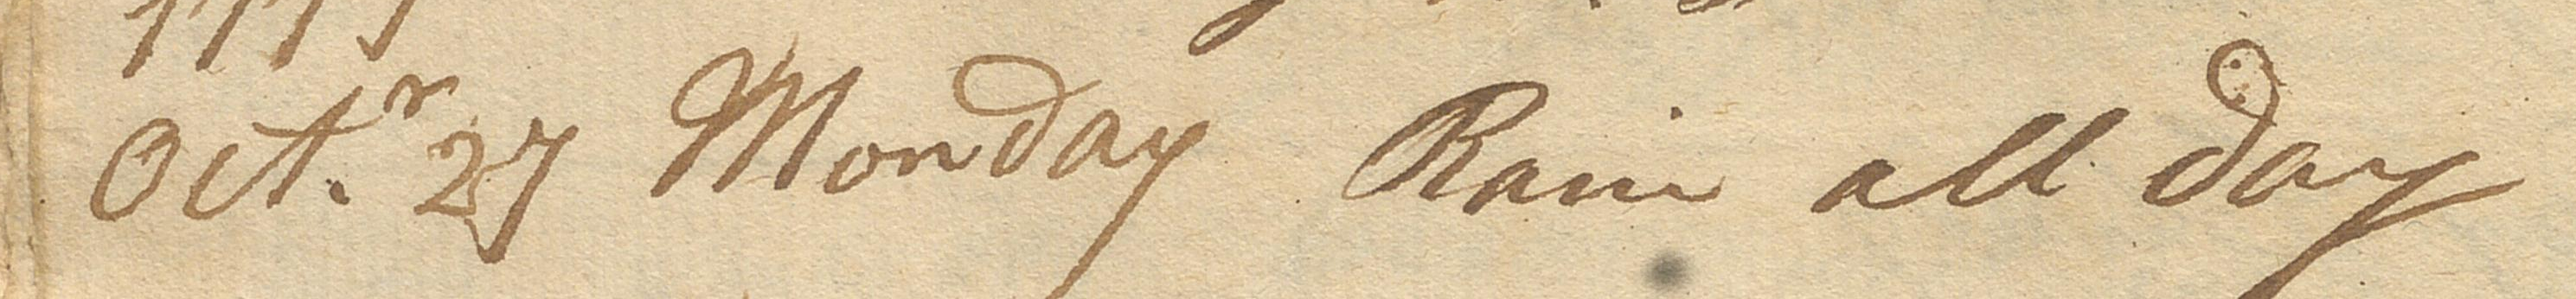Oct^r. 27 Monday Rain all day
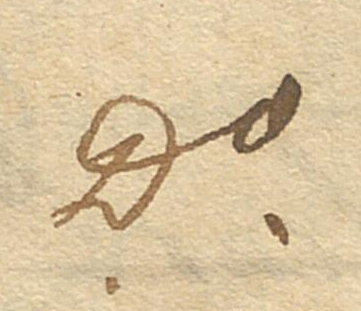D^o.
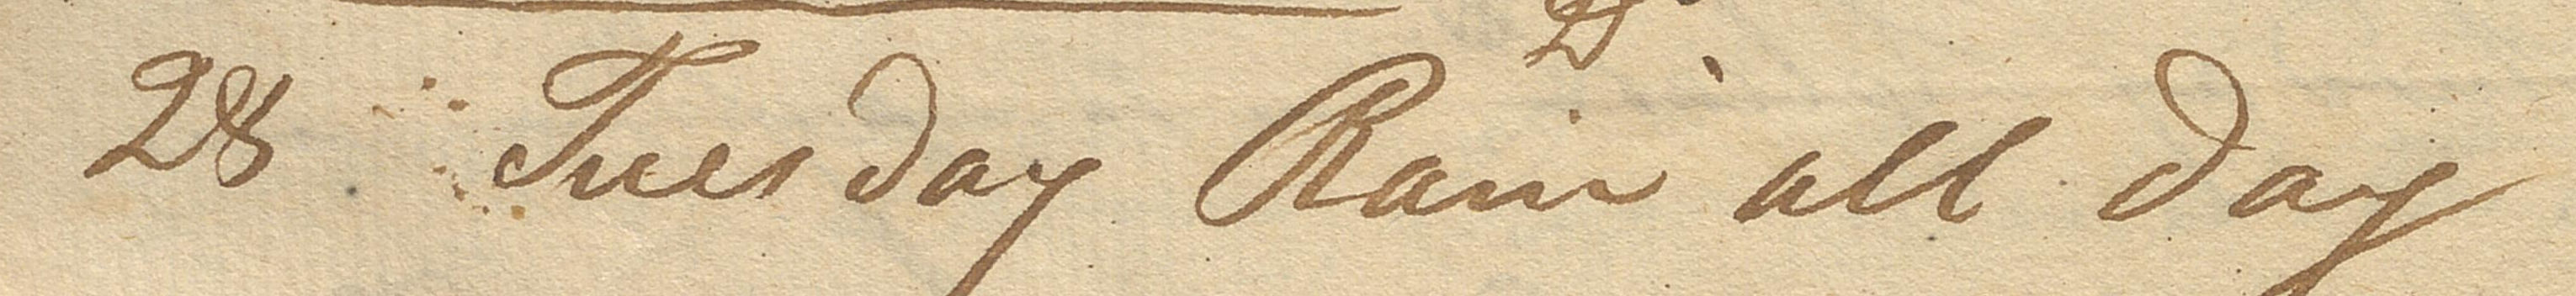28. Tuesday Rain all day
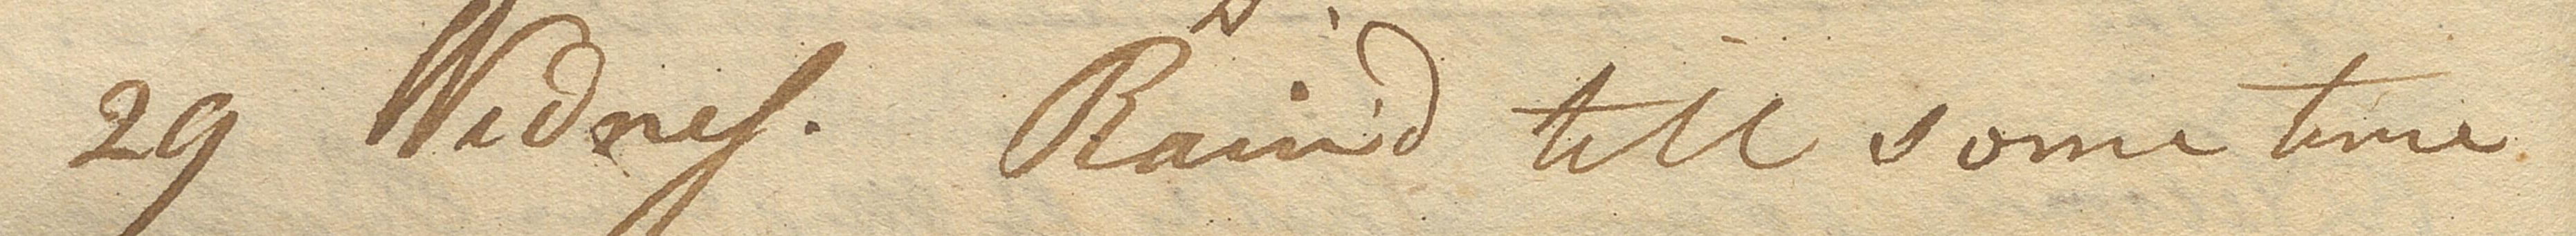29 Wednes. Rain'd till some time
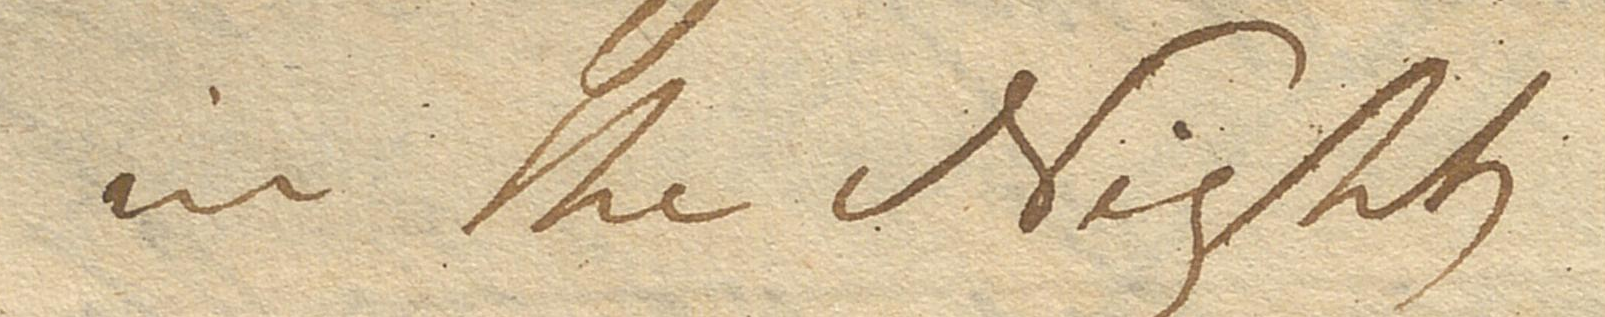in the Night
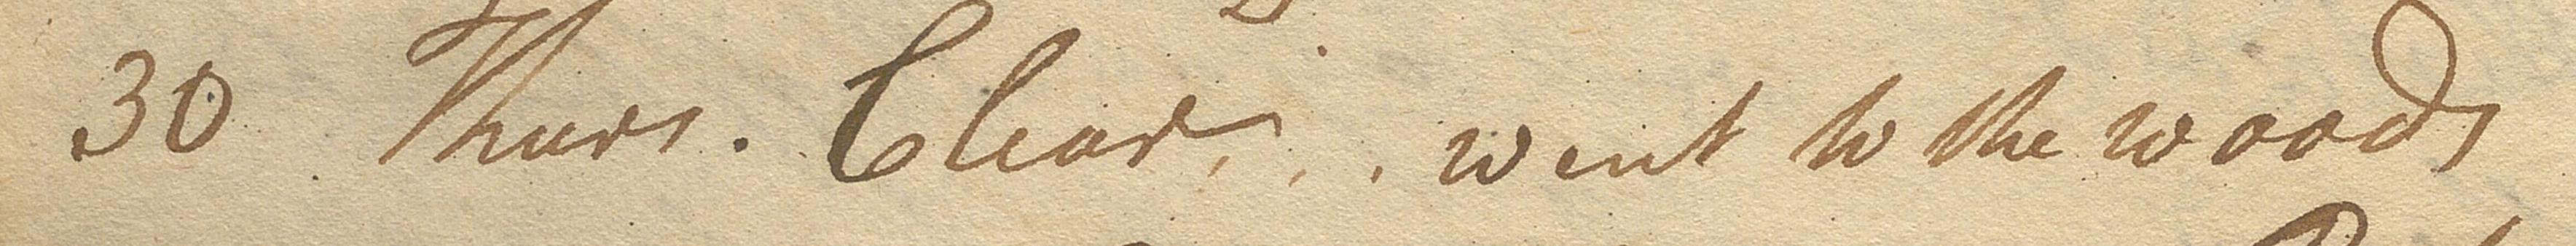30 Thurs. Clear went to the woods
